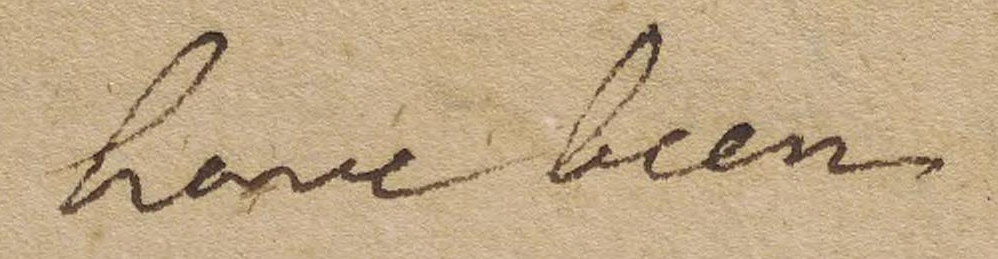have been
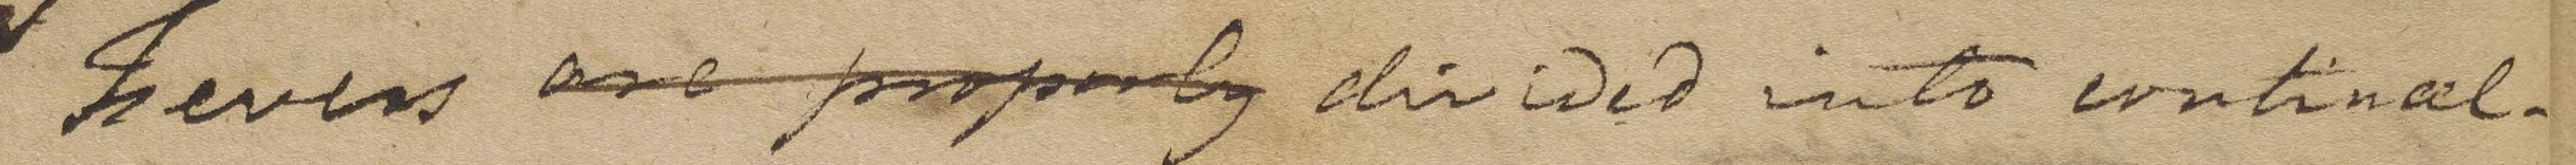Fevers [are properly] divided into continual,
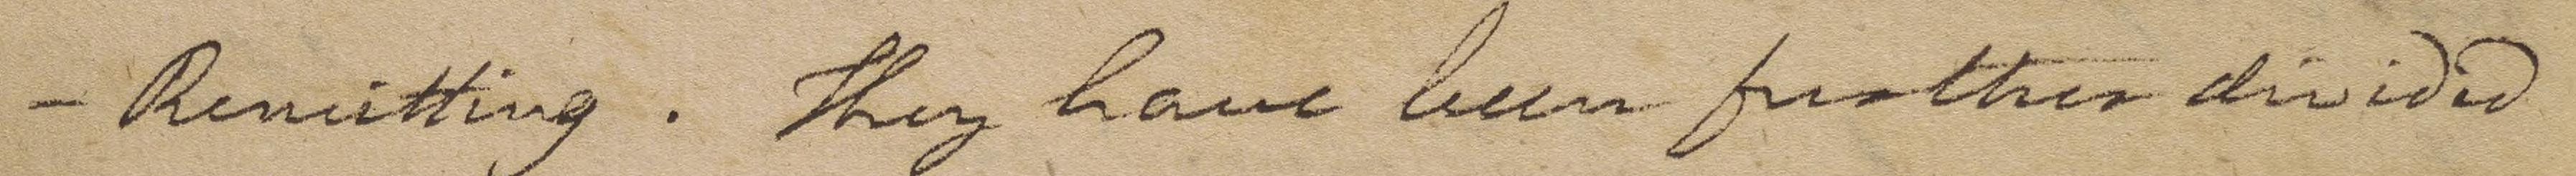-remitting. They have been further divided
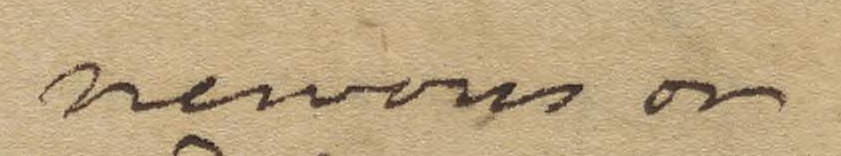nervous or
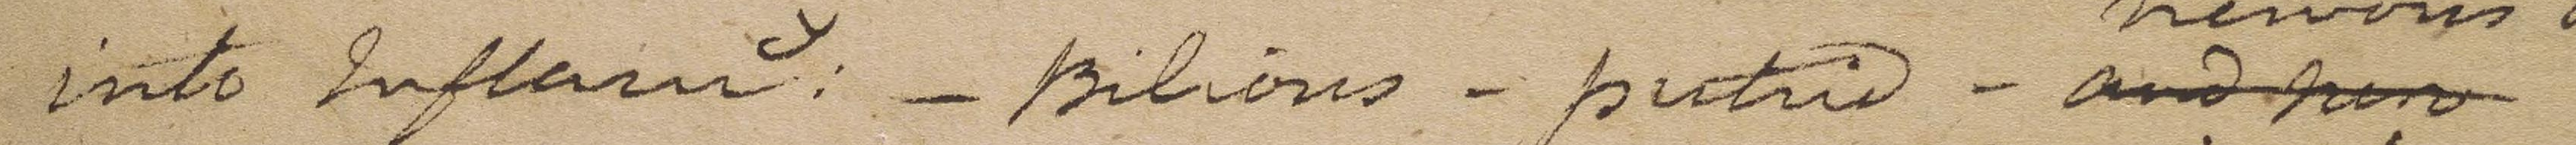into inflam^y:- bilious- putrid- [and ner]
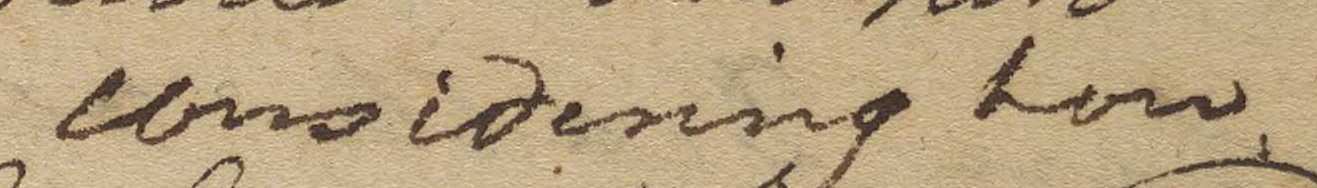considering how
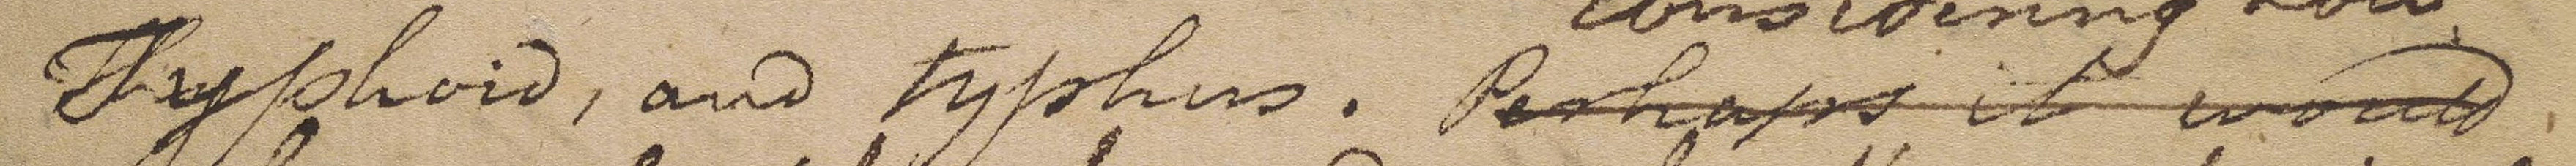Typhoid, and typhus. [Perhaps it would]
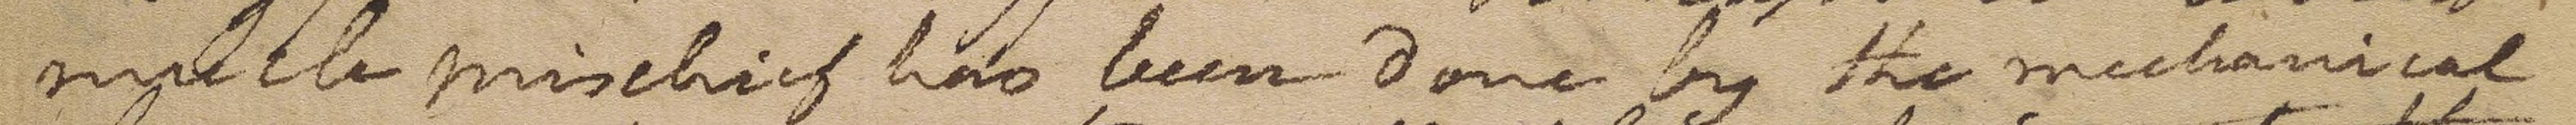much mischief has been done by the mechanical
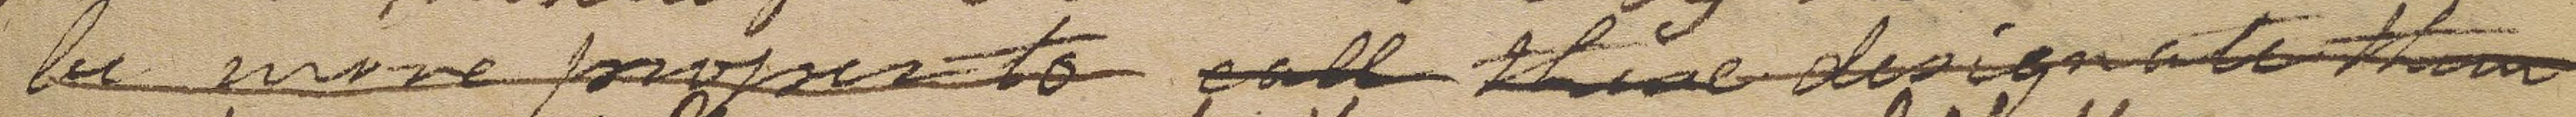[be more proper to call these designate them]
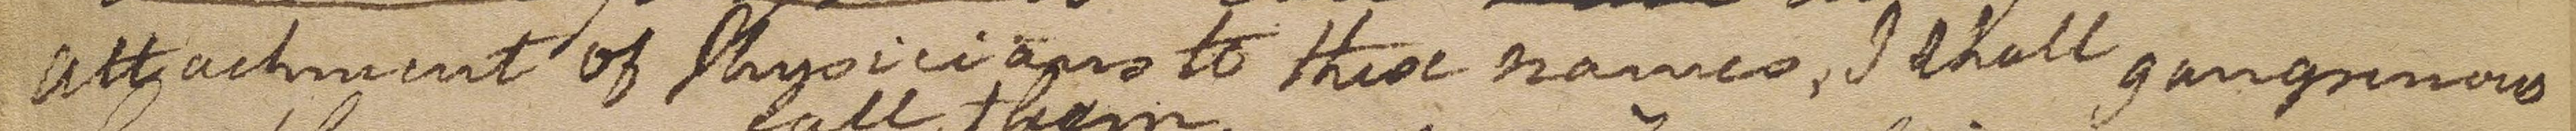attachment of Physicians to these names, I shall gangrenous
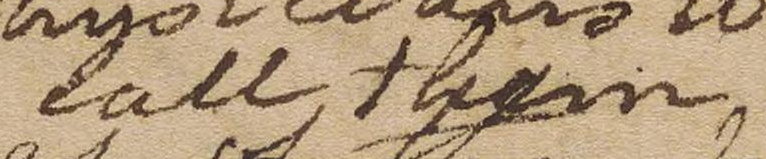call them
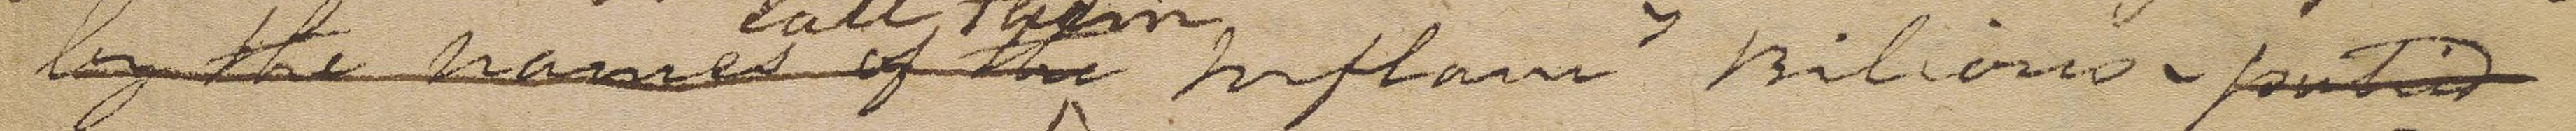[by the names of the] ^ inflam^y bilious- [putrid]
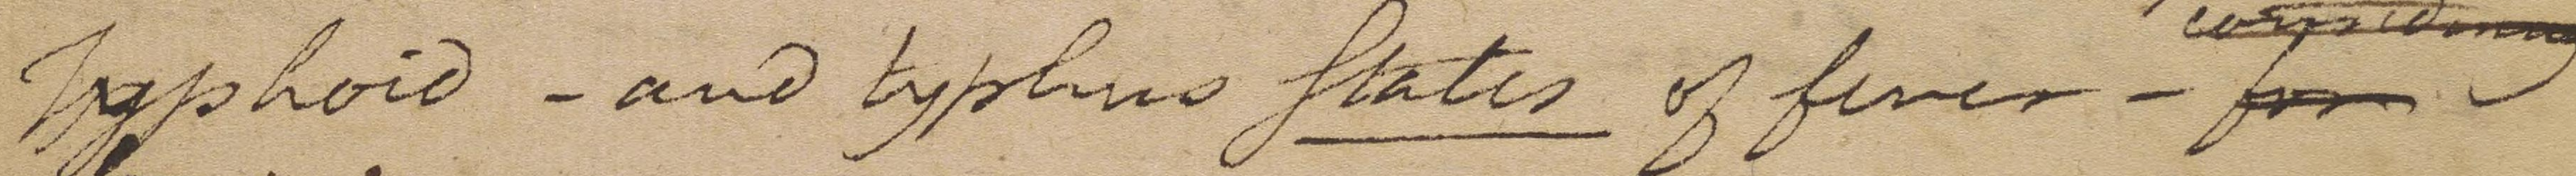typhoid, and typhus states of fever- [for]
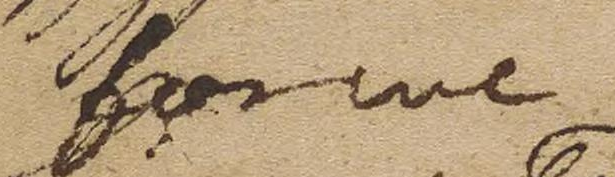for we
